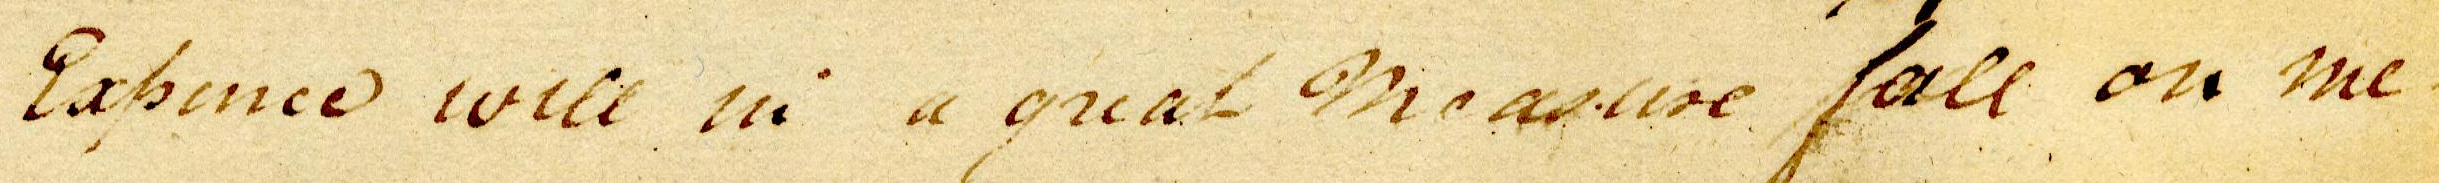Expence will in a great measure fall on me
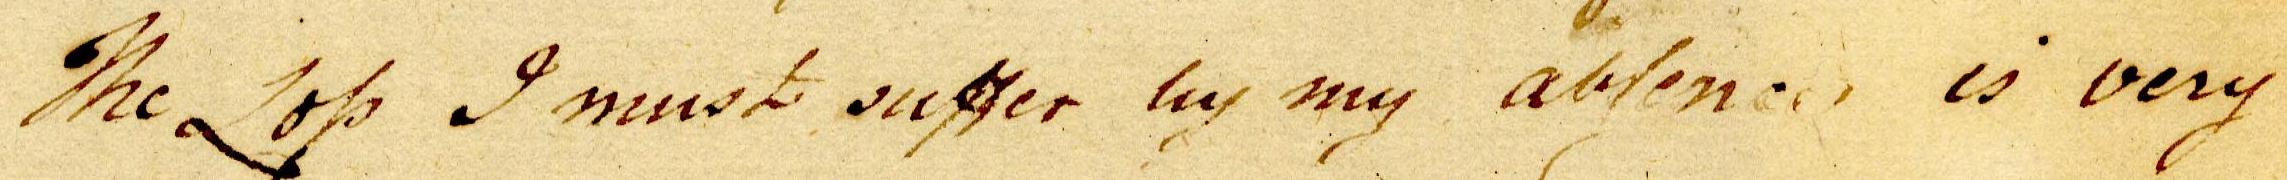The Loss I must suffer by my absence is very
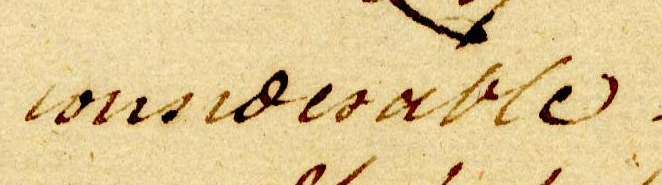considerable.
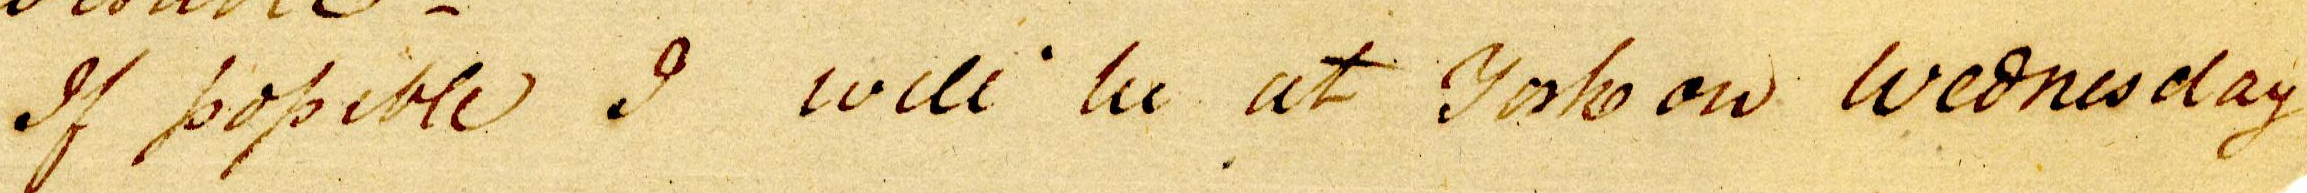If possible I will be at York on Wednesday
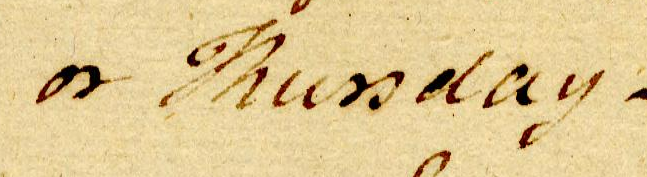or Thursday.
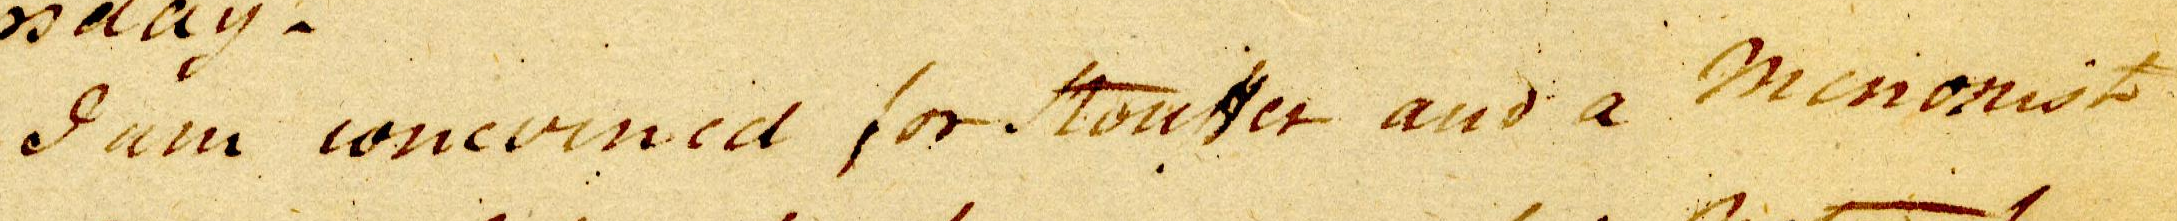I am concvinc'd for Stouffer and a Menonist
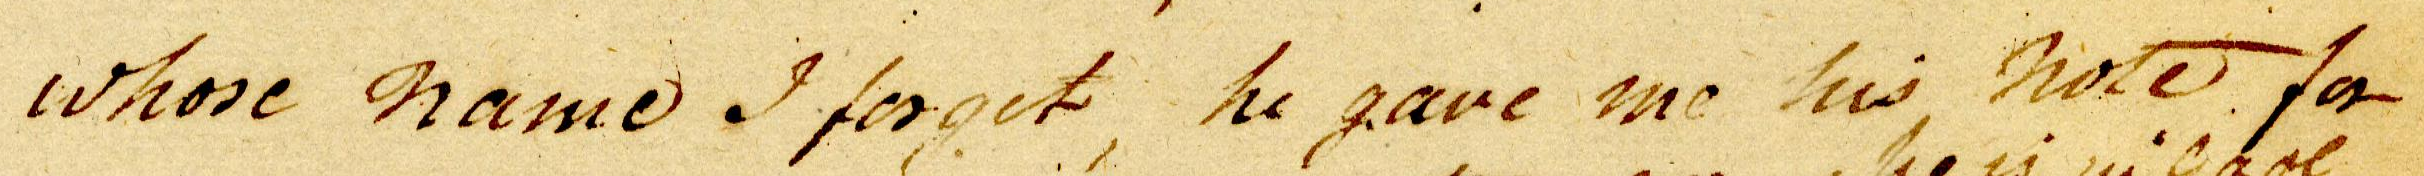whose name I forget he gave me his Note for
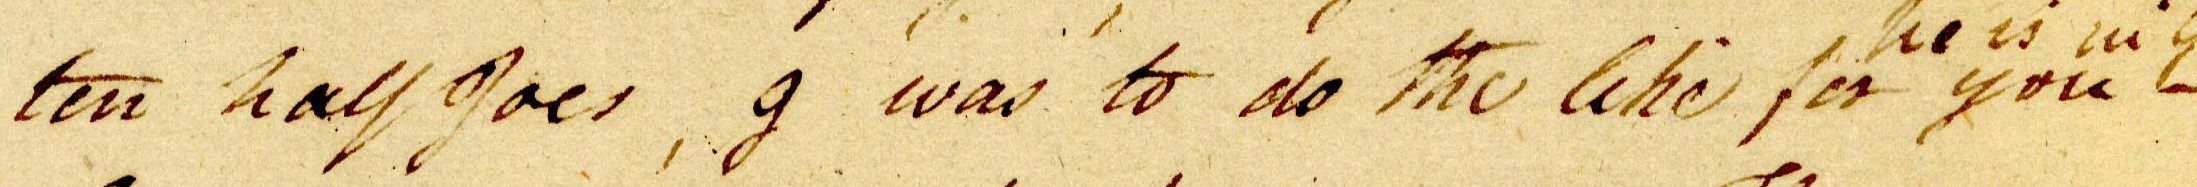ten half goes, I was to do the like for you
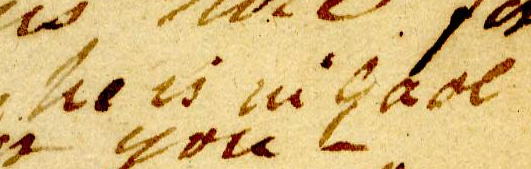he is in Gaol
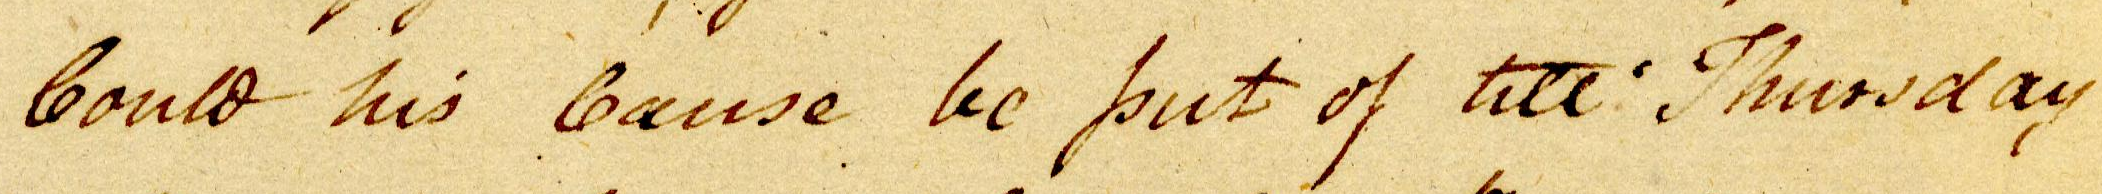Could his Cause be put of till Thursday
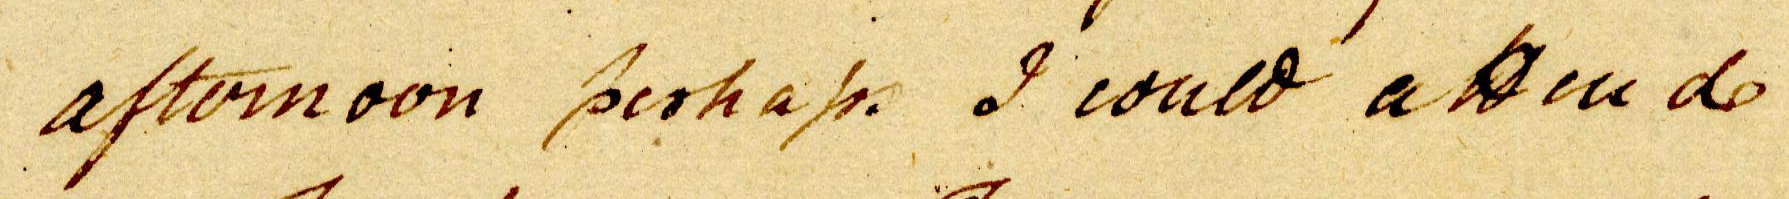afternoon perhaps I could attend
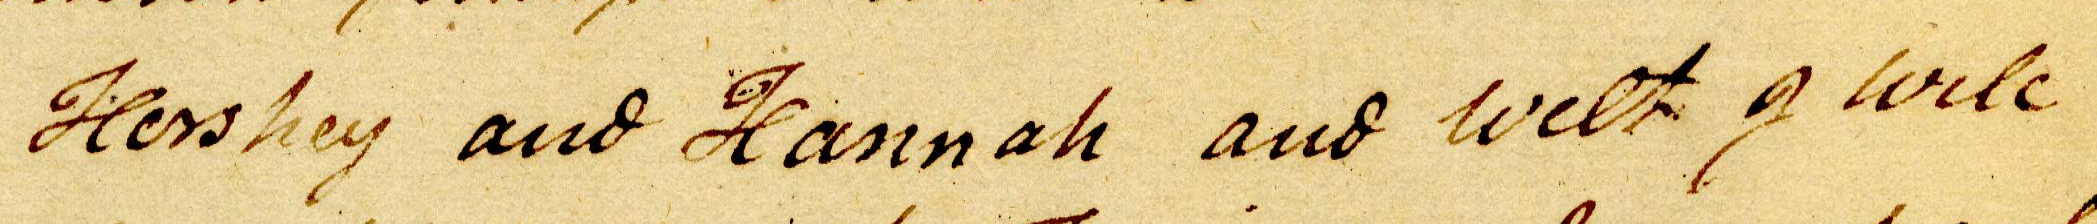Hershey and Hannah and welt I will
